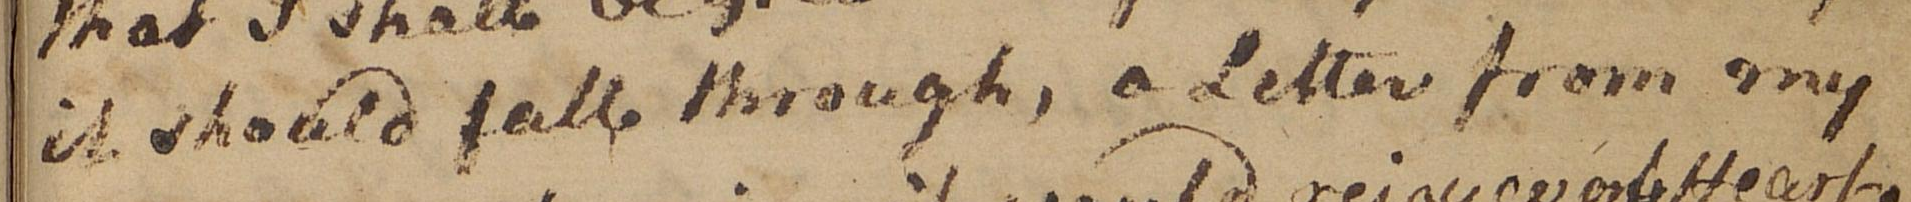it should fall through, a Letter from my
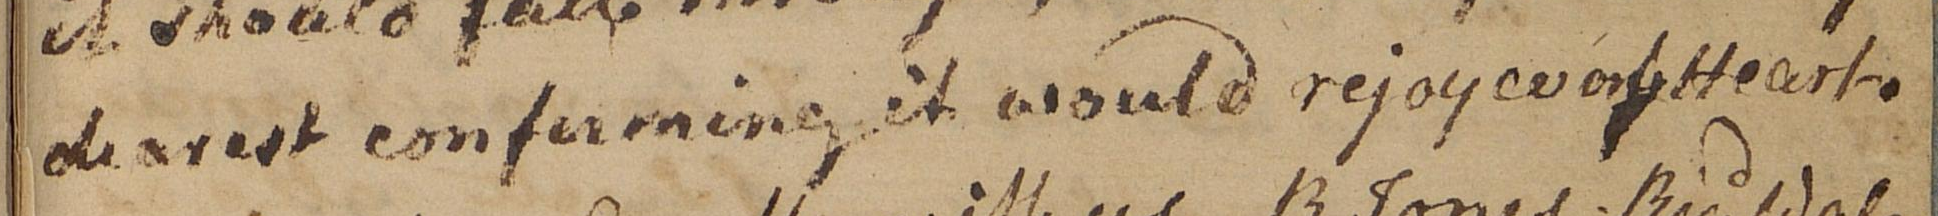dearest confirming it would rejoyce my Heart.
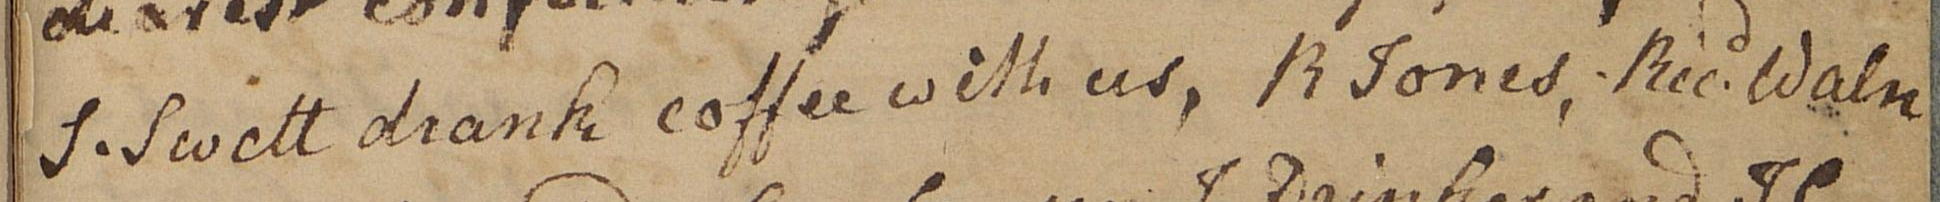S. Swett drank coffee with us, R Jones, Ric^d. Waln
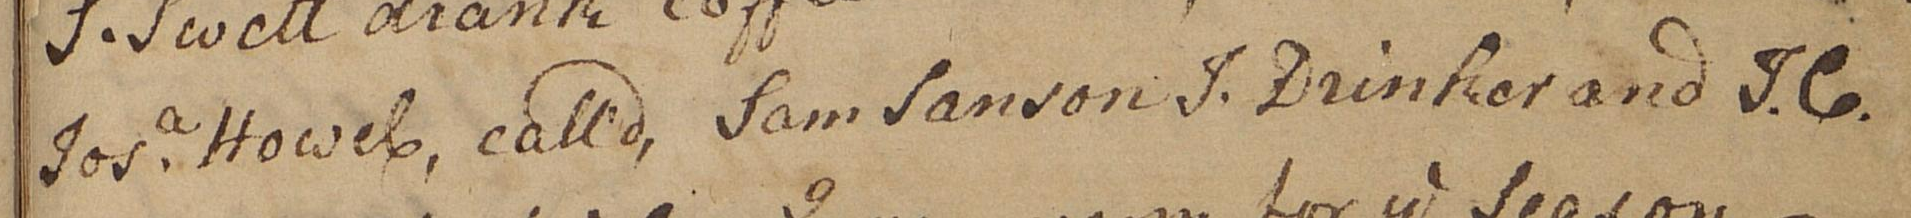Jos^a. Howel, call'd, Sam Sanson I. Drinker and l.C.
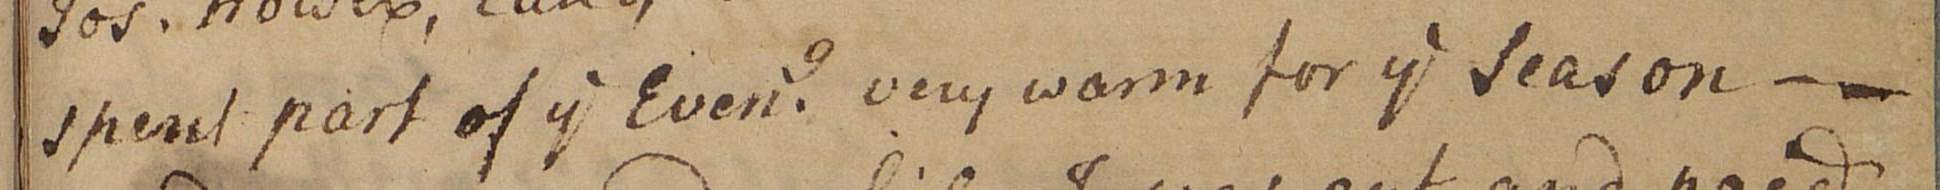spent part of y^e Even^g. very warm for y^e season-
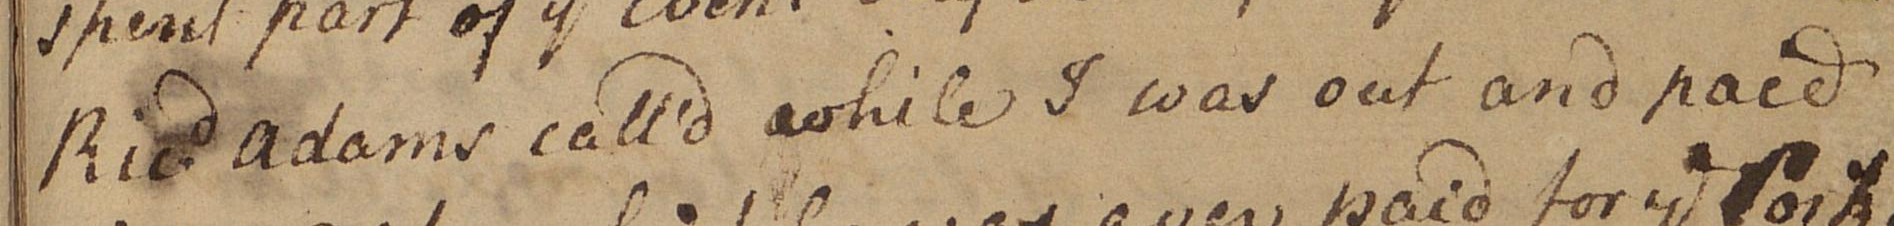Ric^d. Adams call'd while I was out and paid
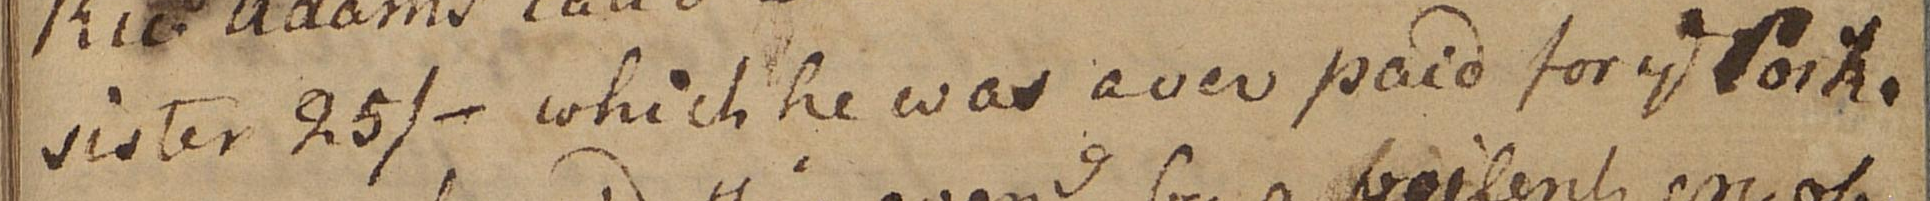sister 25s- which he was aver paid for y^e Pork.
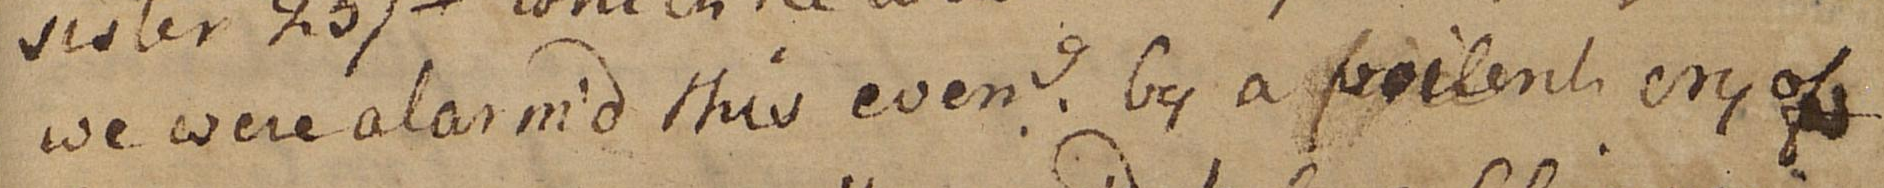we were alarm'd this even^g. by a voilent cry of
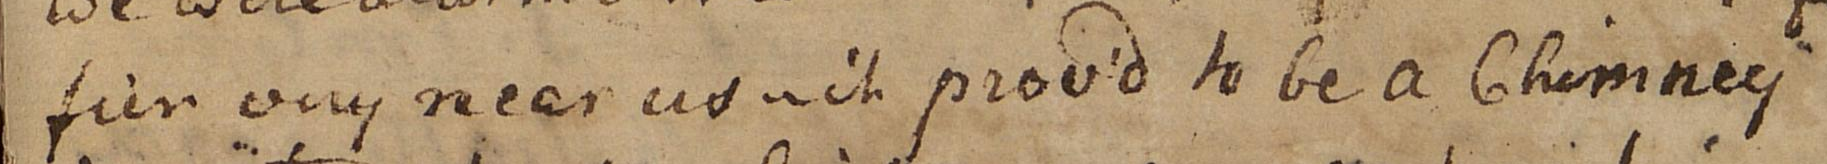fier very near us-it prov'd to be a Chimney
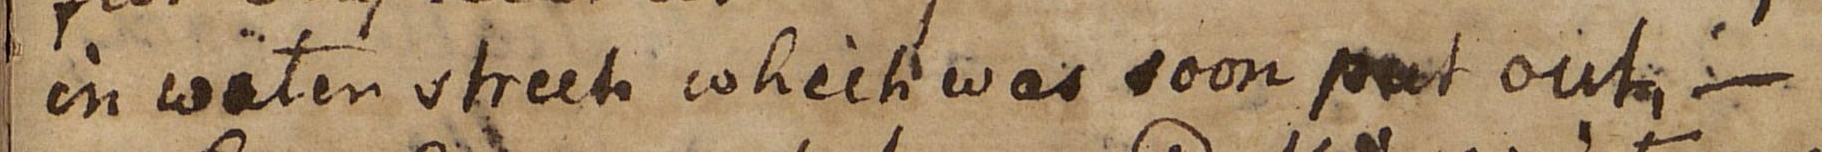in water street which was soon put out-
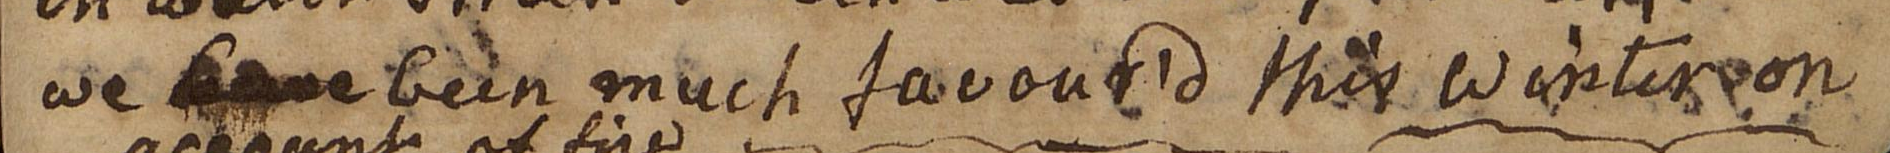we have been much favour'd this Winter on
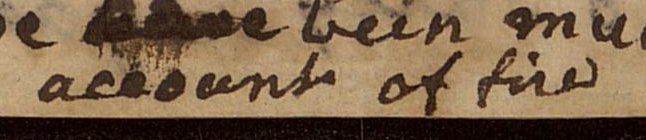account of fire
